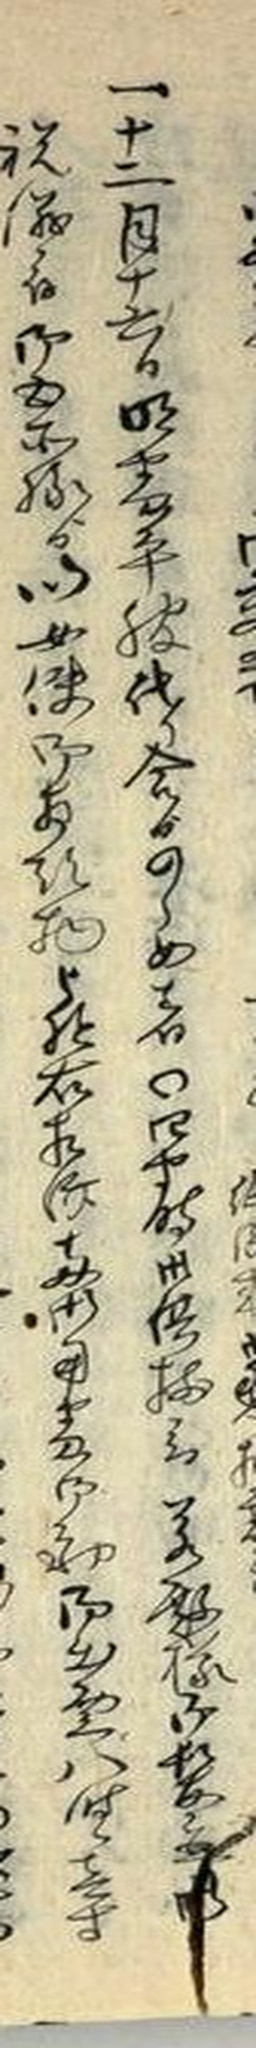祝儀ニ付御五所様ゟ以女使御拝領物被遊右相済両御用番御勤御出殿八時へ壱寸
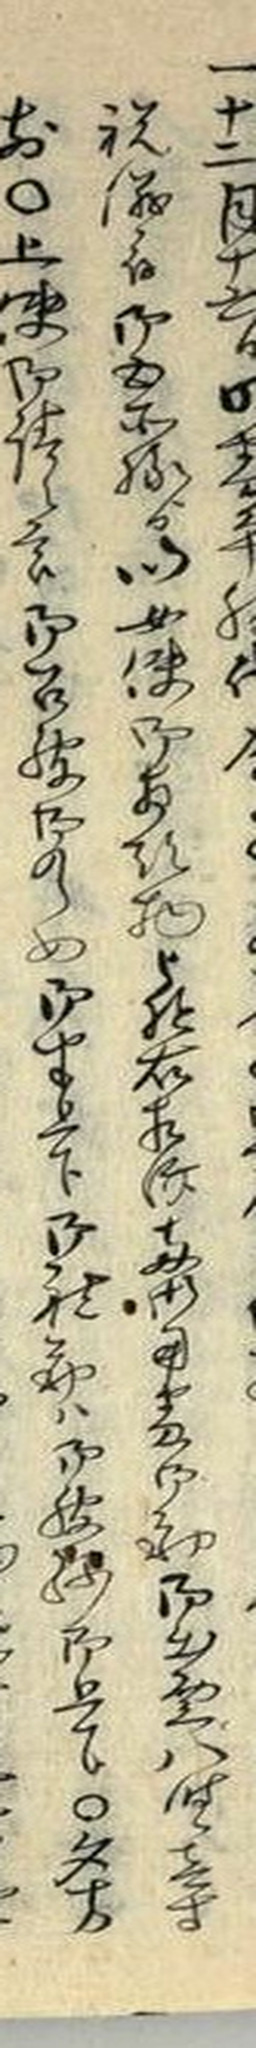前〇上使御請候節御召服御のしめ御半上下御礼勤ハ御服紗御上下〇夕方
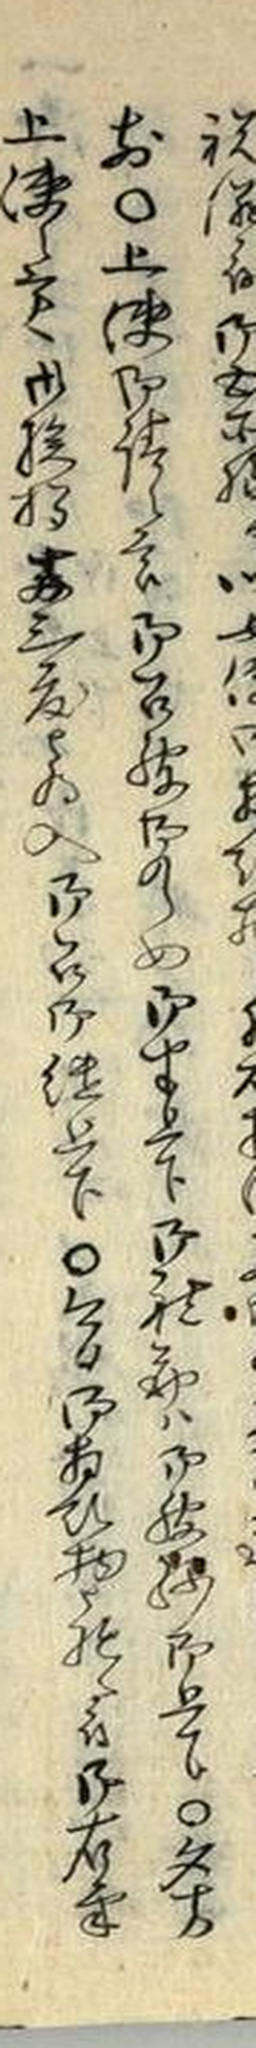上使之方へ御挨拶両三度被為入御召御継上下〇今日御拝領物被遊候ニ付御右筆
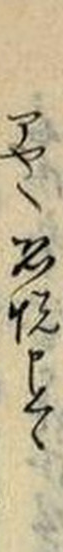部やへ恐悦申上候
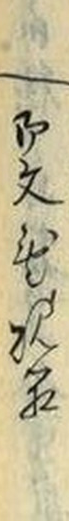御文台硯箱
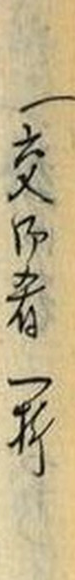交御肴一折
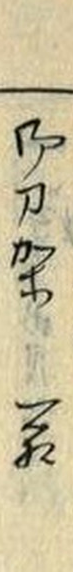御刀架一箱
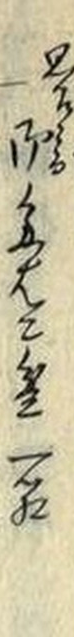御たはこ盆一箱
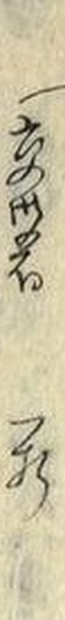交御肴一折
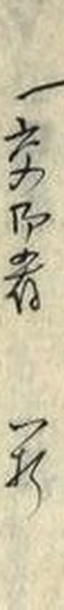交御肴一折
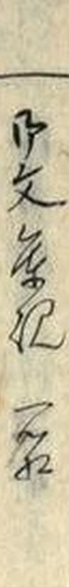御文庫硯一箱
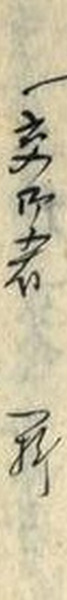交御肴一折
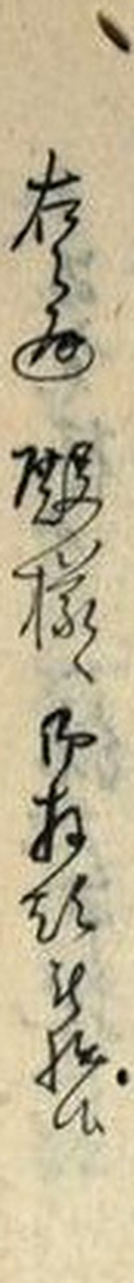右之通殿様へ御拝領被遊候

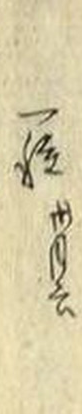一種御目六
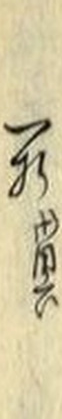一種御目六
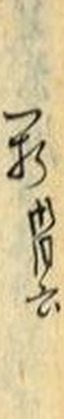一種御目六
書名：少傅日録抄（斉承付側向頭取日記、在府）
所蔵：福井県文書館 Fukui Prefectural Archives
